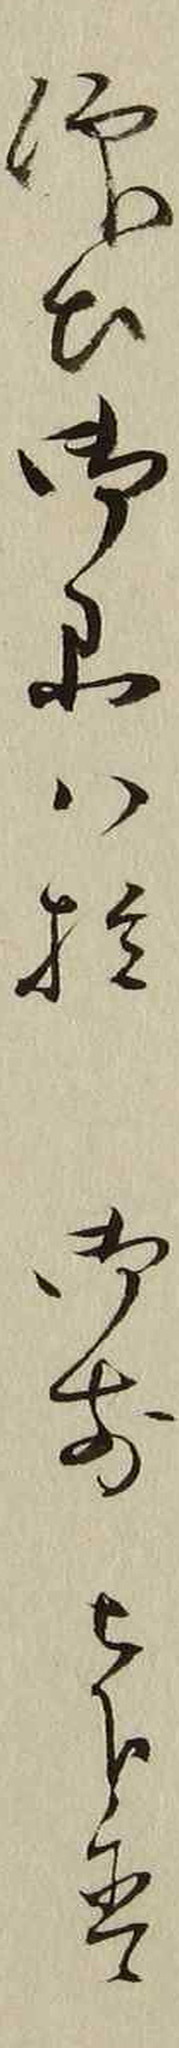仰出御品は於御前被下置候
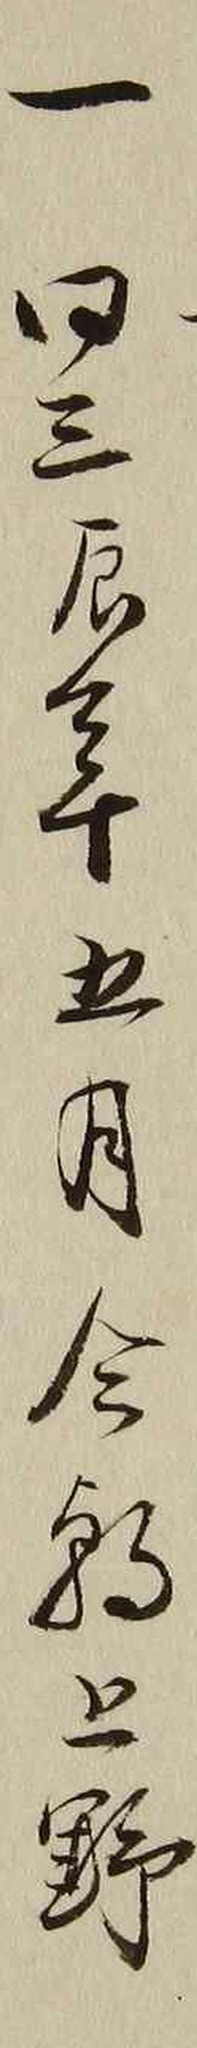一同三辰年五月今朝上野
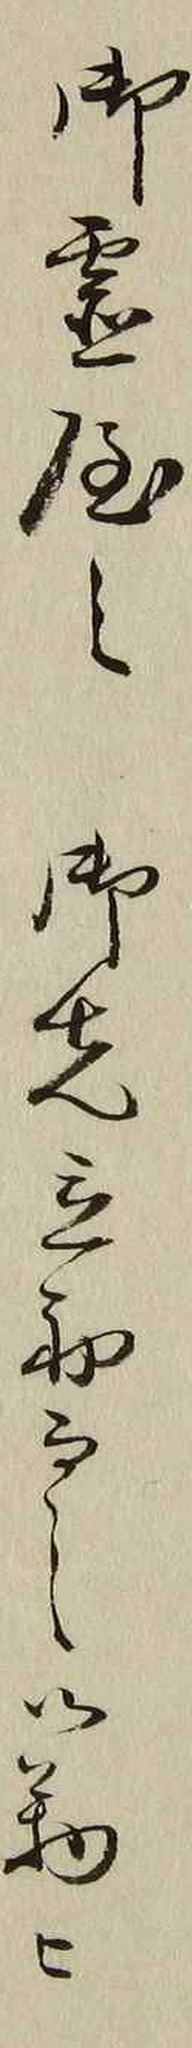御霊屋之御先立初而之御勤被
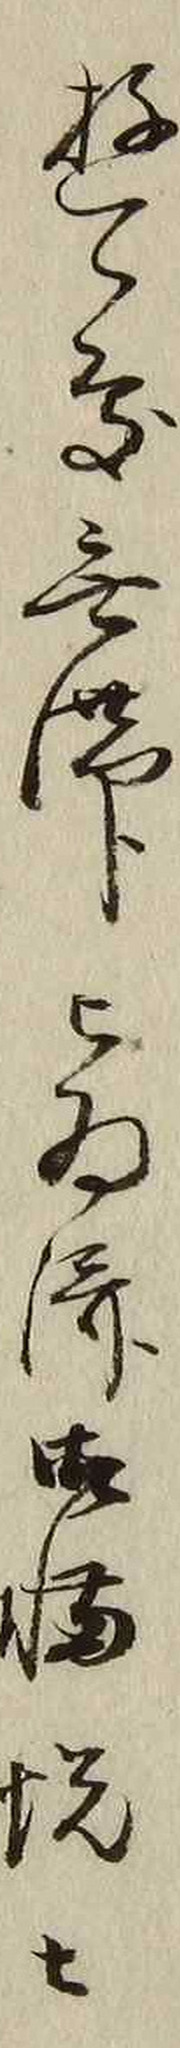遊候処無滞被為済御満悦被
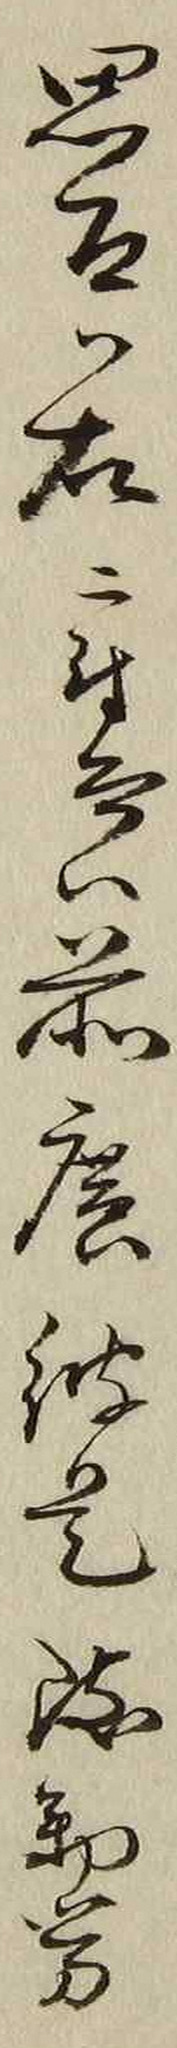思召候右に付而は前広彼是致勤労
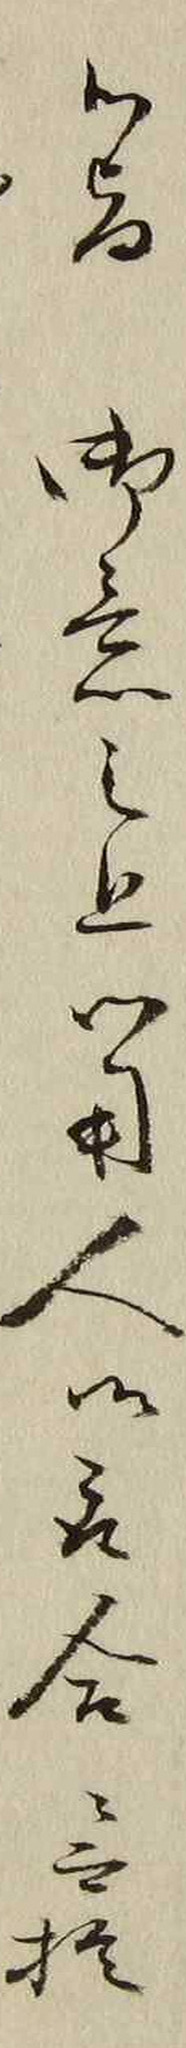候旨御意之上御用人御取合に而於
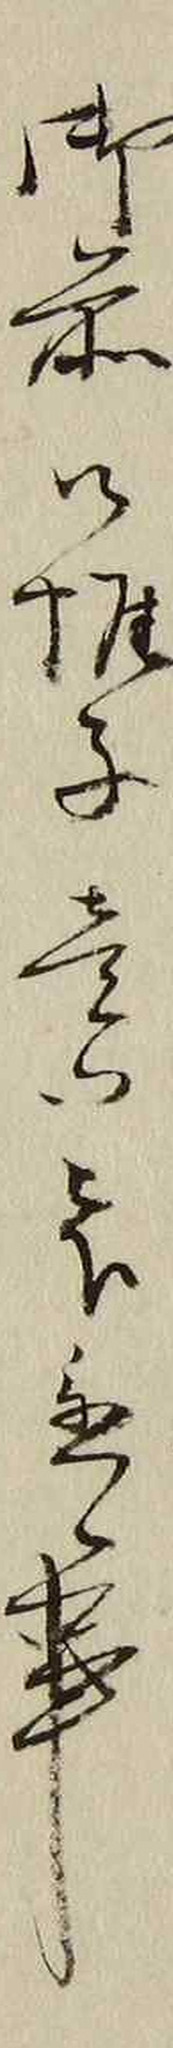御前御帷子壱つ被下置候事
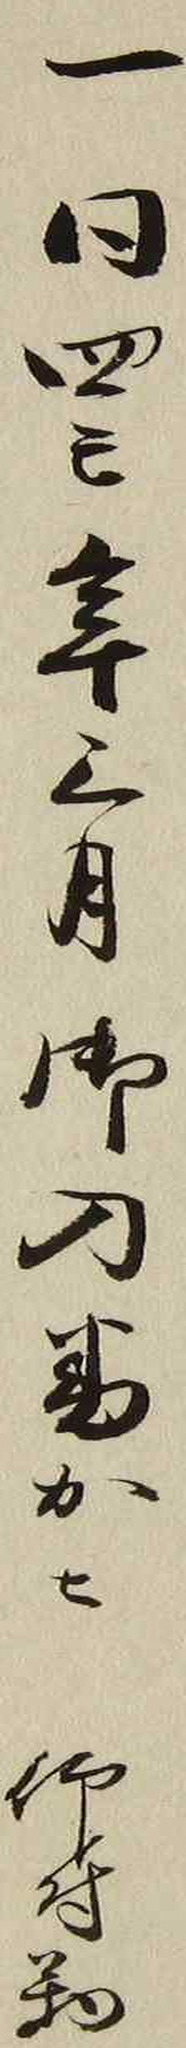一同四巳年三月御刀番加被仰付勤
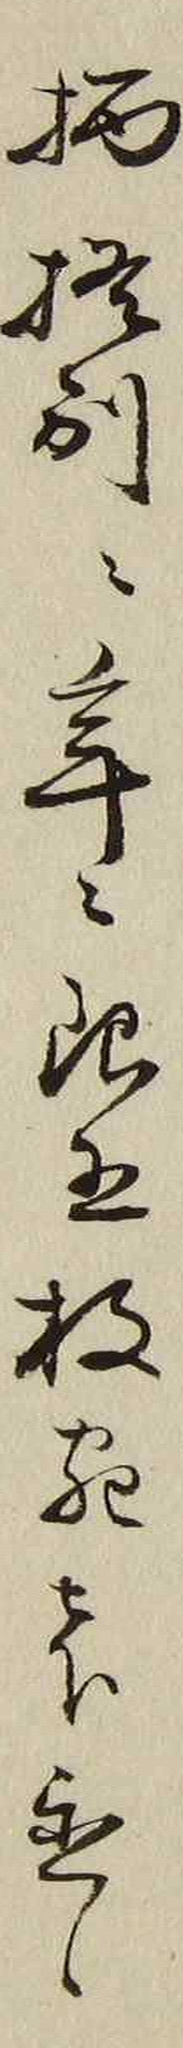柄格別に年々銀五枚宛被下置候
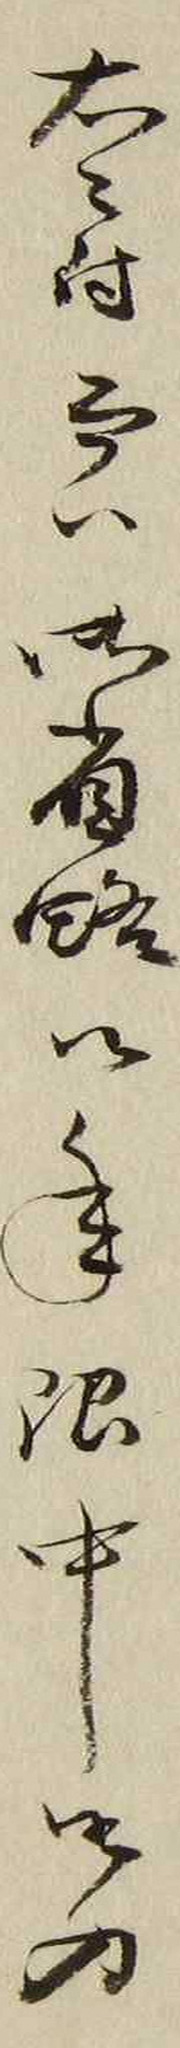右に付而は御省略御年限中御刀
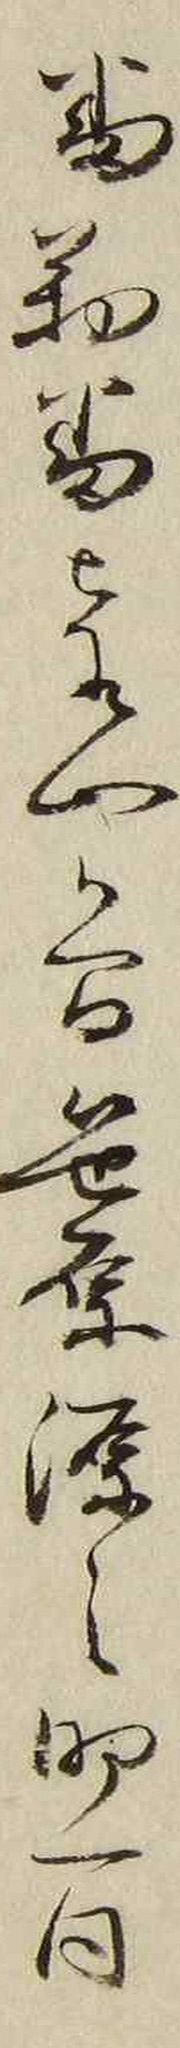番勤番被相止候間笹原源之佐一同
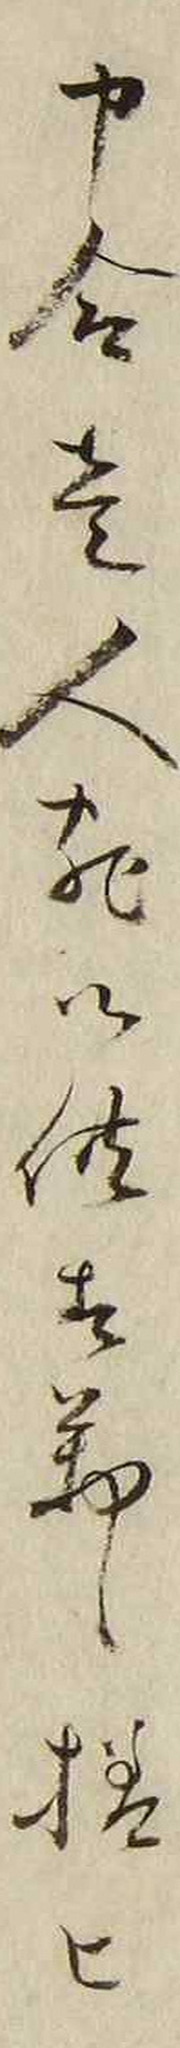申合一人宛御供相勤候様被

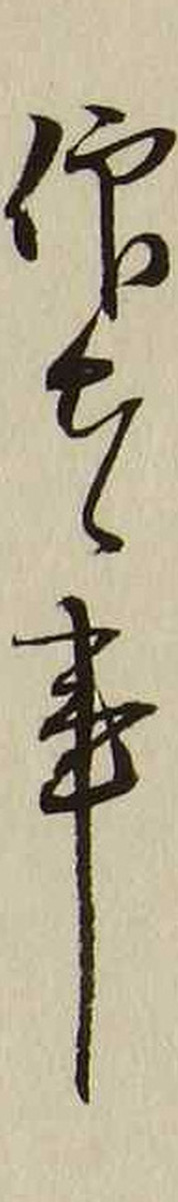仰出候事
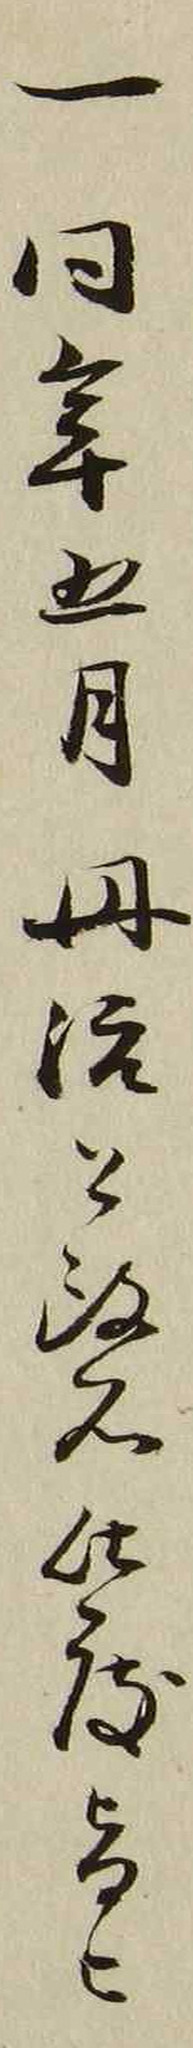一同年五月丹治と改名仕度旨被
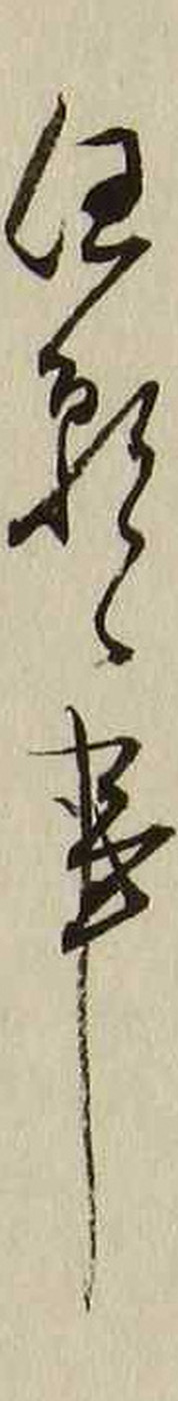任願候事
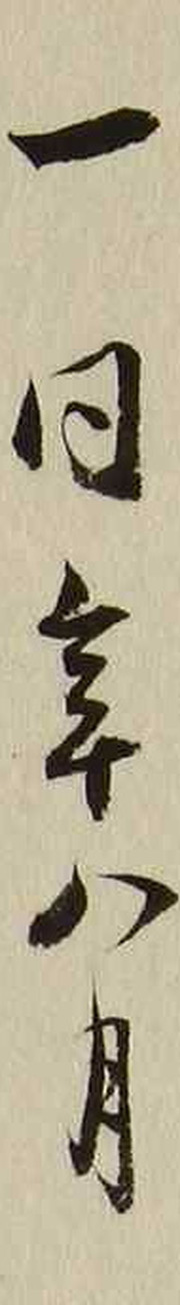一同年八月
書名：諸士系譜　巻之292　き之部1
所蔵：会津若松市立会津図書館
